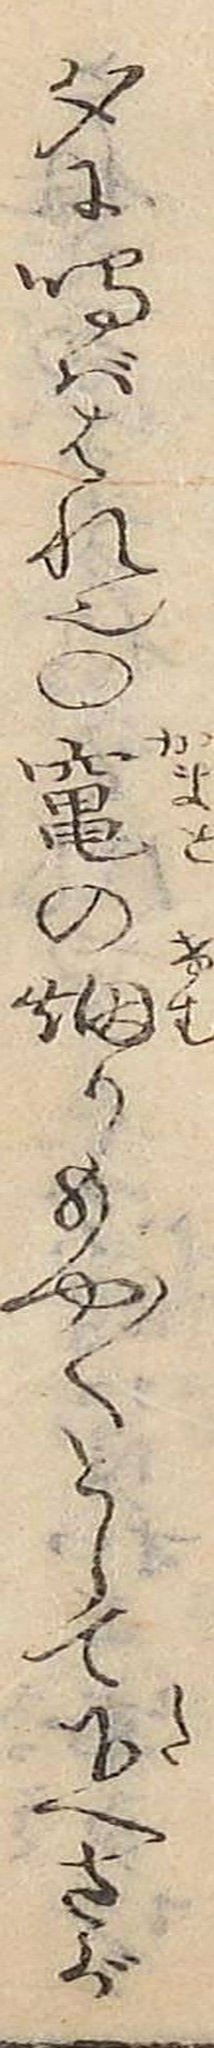夕に鳴ばはれ也○竃の煙りもや〳〵として下へさが
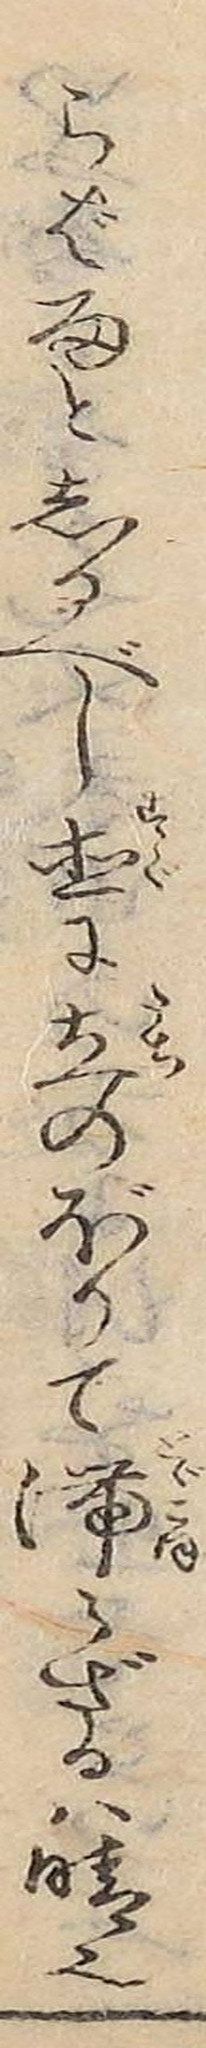らば雨としるべし直に立のぼりて滞らざるは晴也
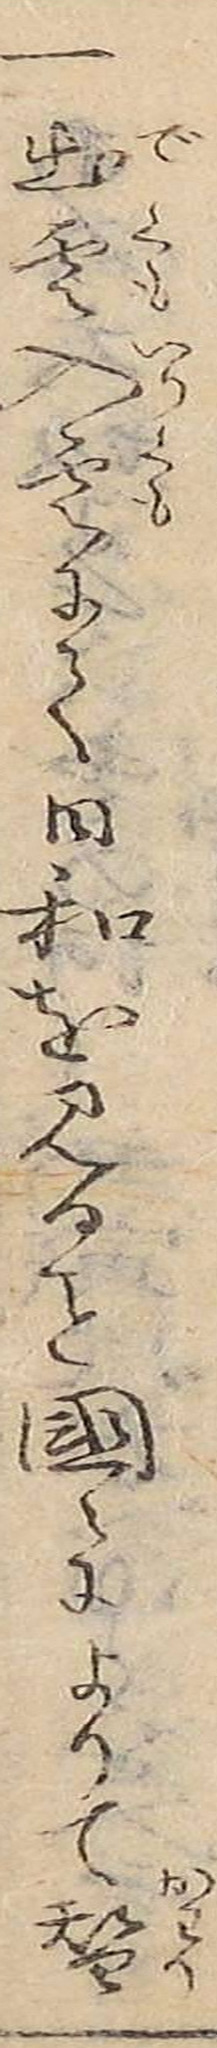一出雲入雲にて日和を見ること国々によりて替

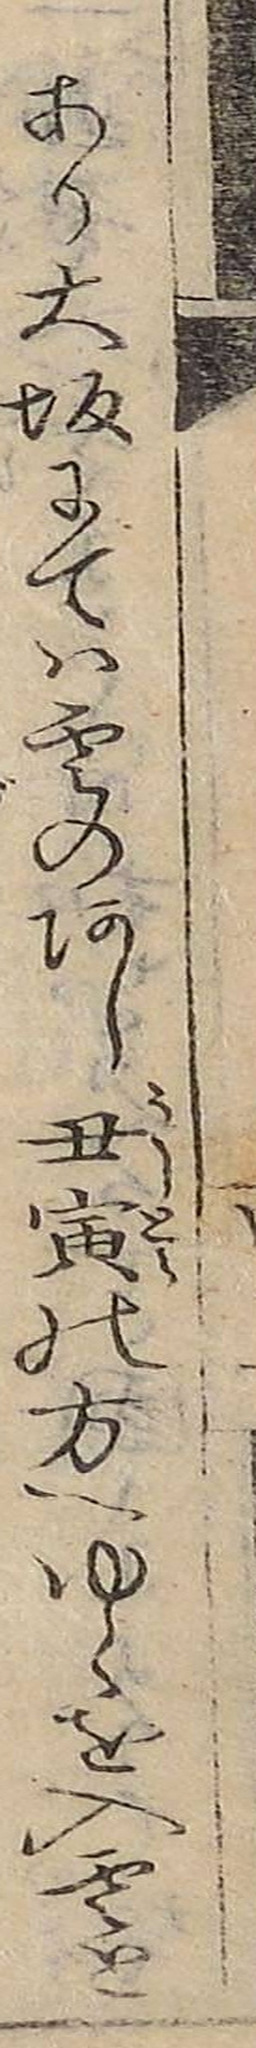あり大坂にては雲のあし丑寅の方へゆくを入雲と
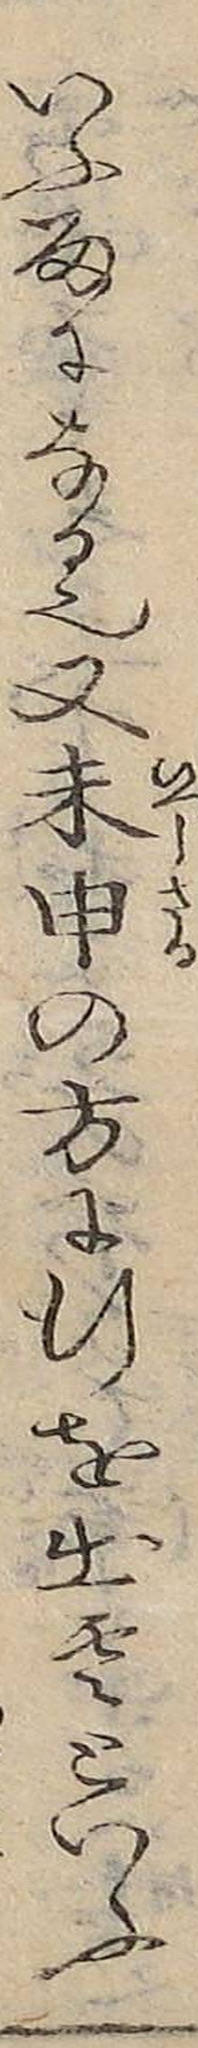いふ雨になる也又未申の方に行を出雲といふ
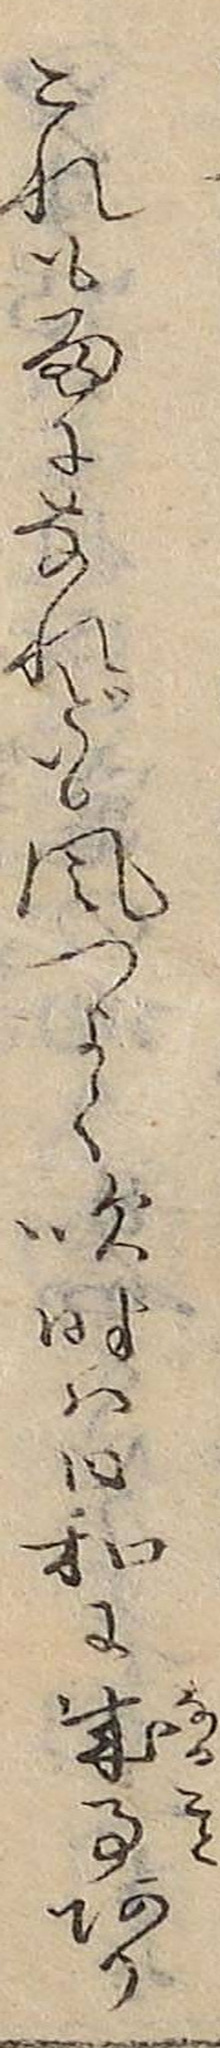これも雨になれども風つよく吹時は日和に成事あり
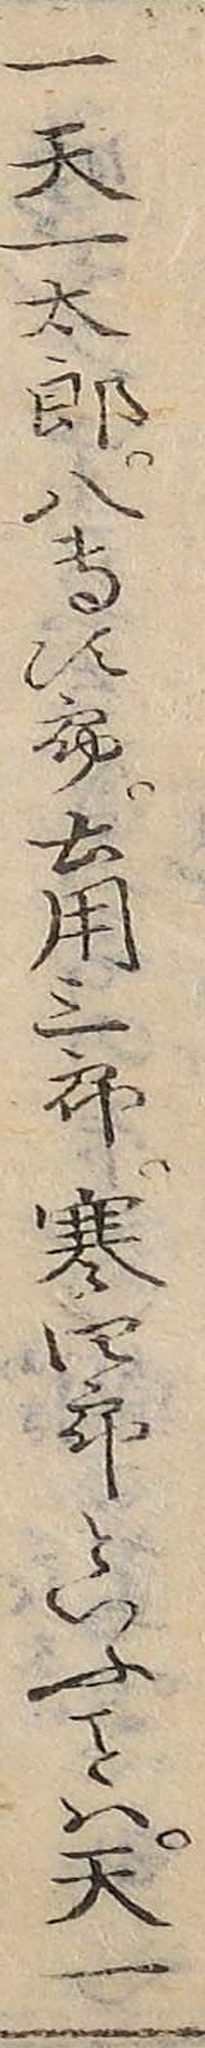一天一太郎。八専次郎。土用三郎。寒四郎といふことは。天一
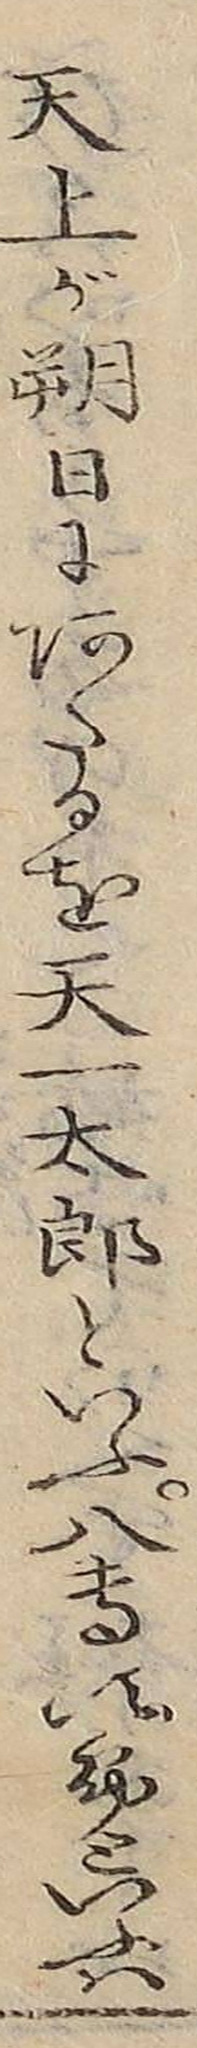天上が朔日にあたるを天一太郎といふ。八専次郎といふは
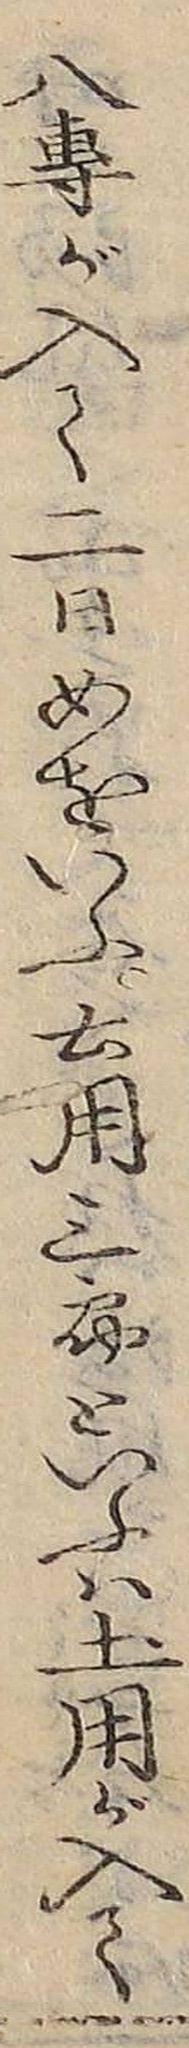八専が入て二日めをいふ。土用三郎といふは土用が入て
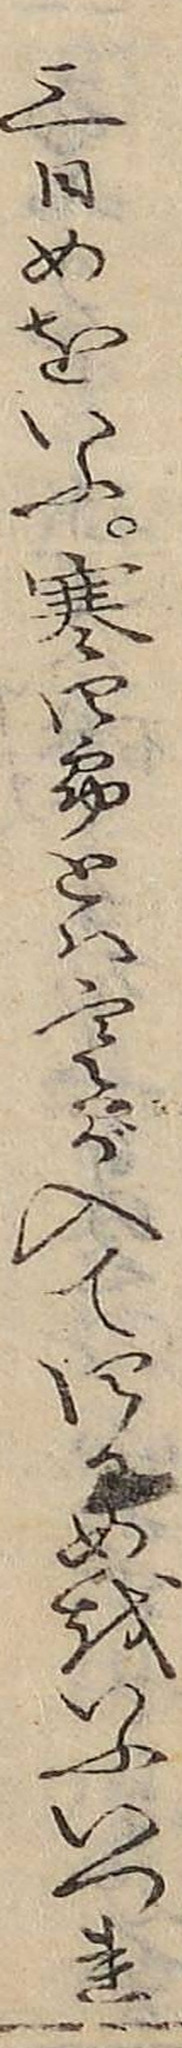三日めをいふ。寒四郎とは寒が入て四日めをいふいつれ
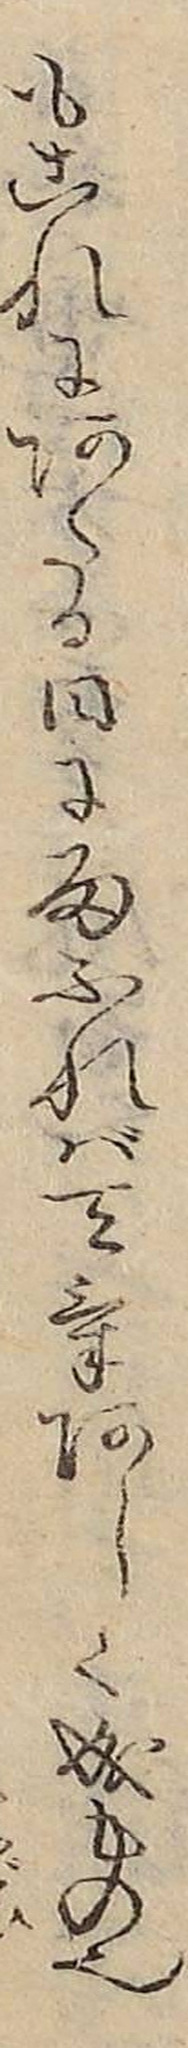もこれにあたる日に雨ふればて気あしく成もの也
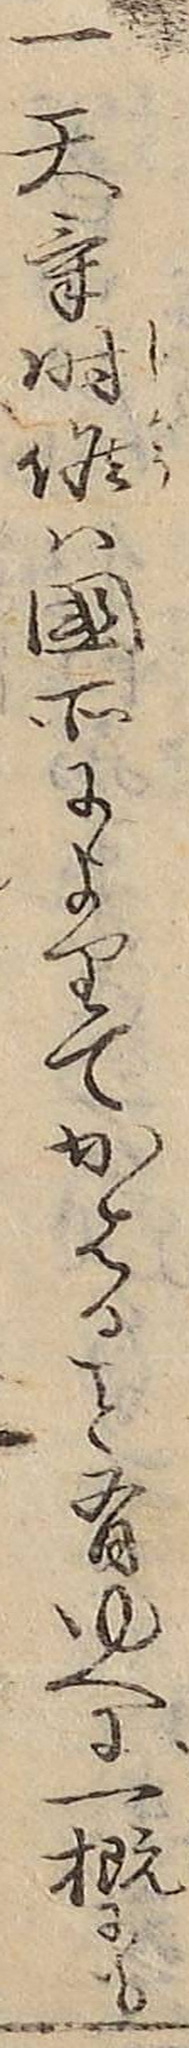一天気時候は国所によりてかはること有ゆへに一概にも
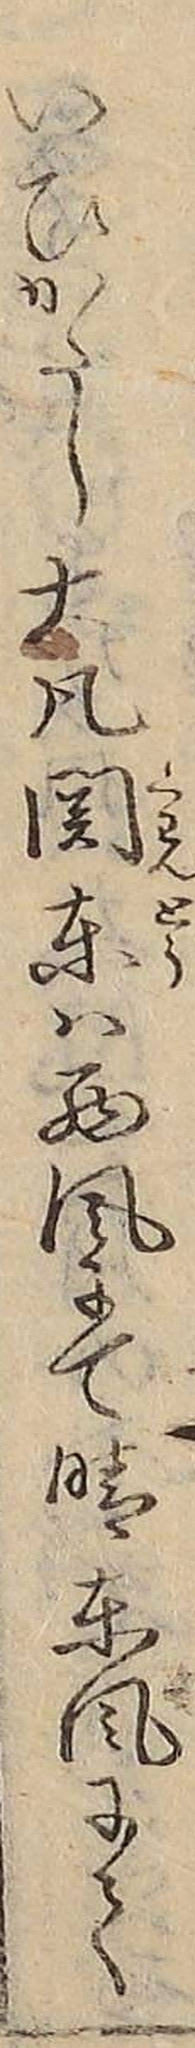いひかたし大凡関東は西風にて晴東風にて
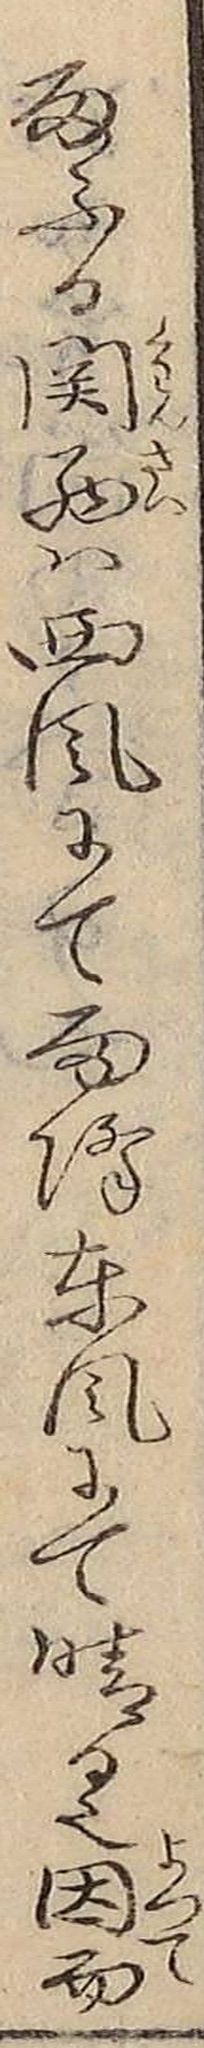雨ふる関西は西風にて雨降東風にて晴る也因而
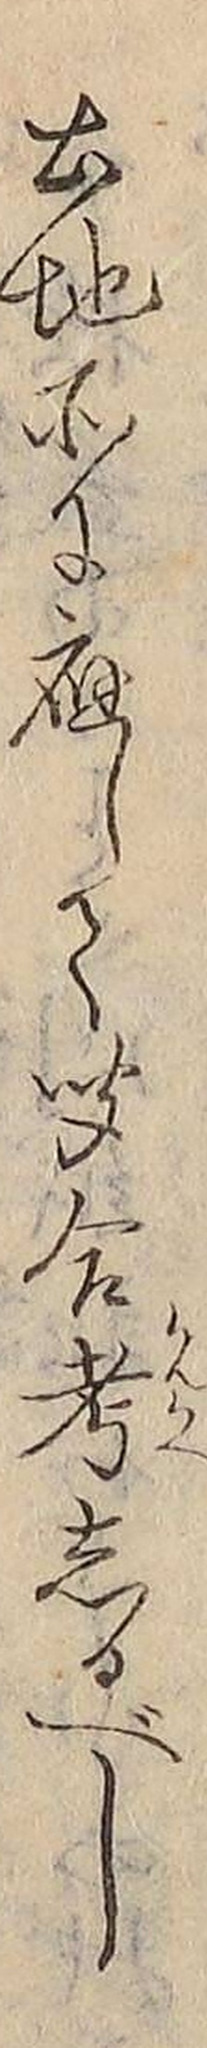土地所に応して聞合考しるべし
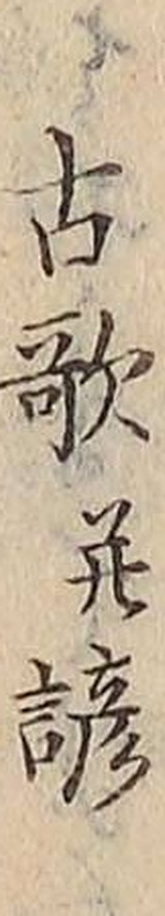古歌并諺
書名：旅行用心集
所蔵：神戸大学附属図書館 国文学研究資料館
